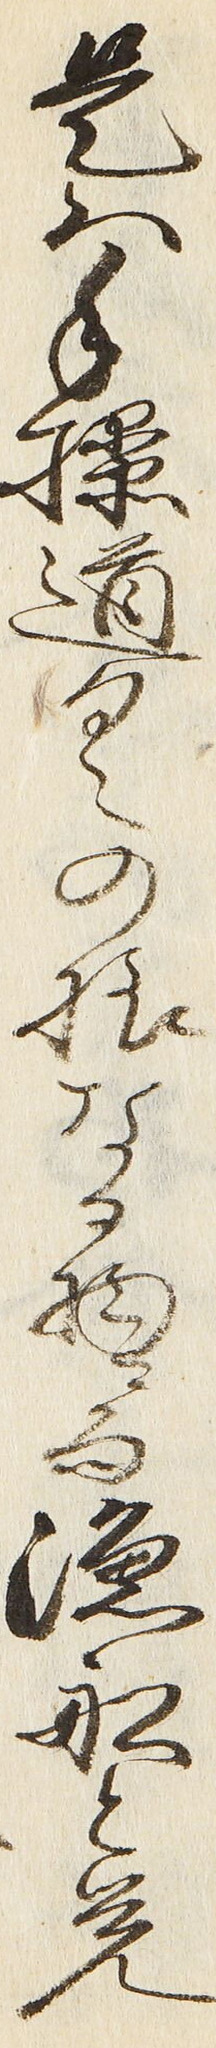是は手繰道具の様なる物にてぎょ漁船と覚
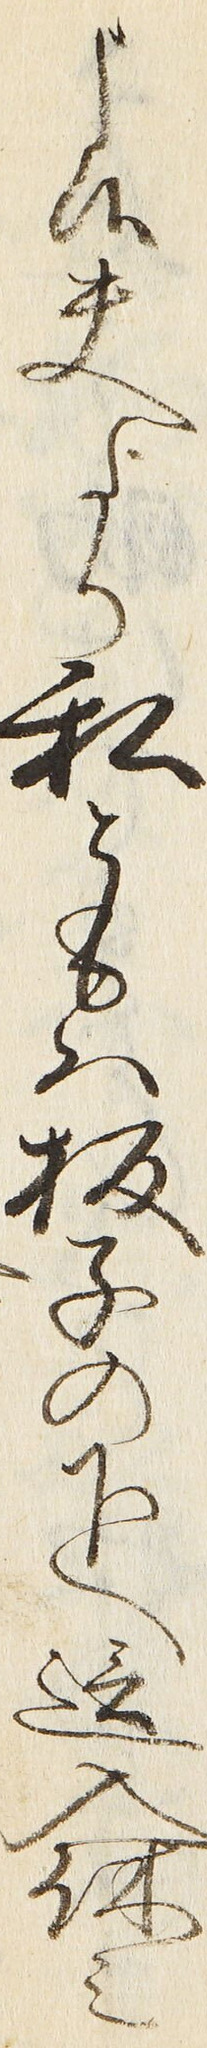申候夫より私ともは板子の下へ這入休み
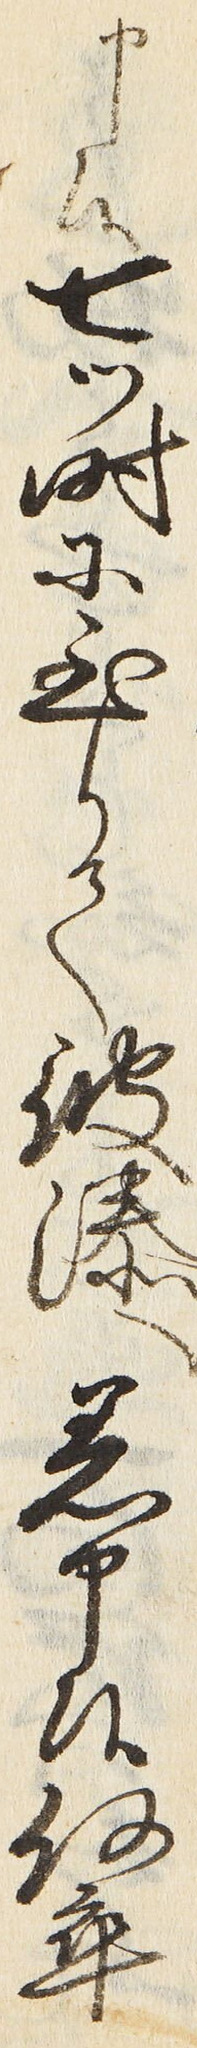申候七ッ時に至りて彼湊へ着申候何卒
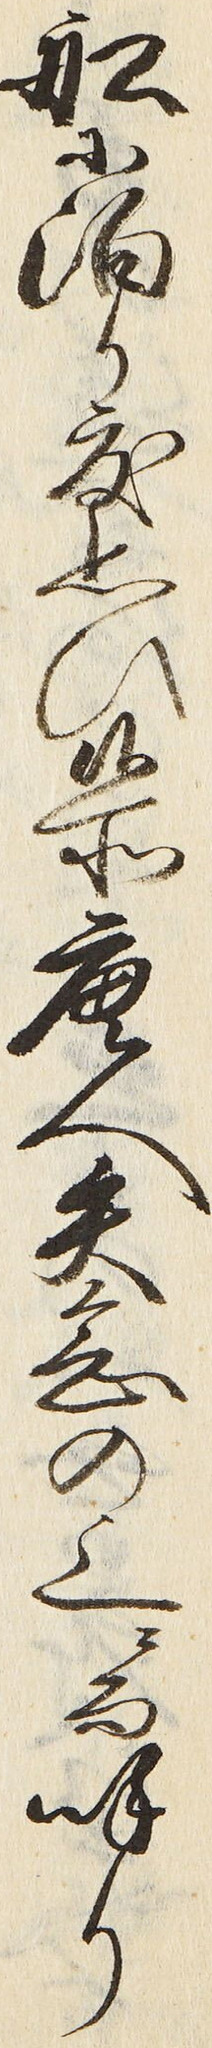船に泊り度思ひ候所唐人失念の上にて呼り
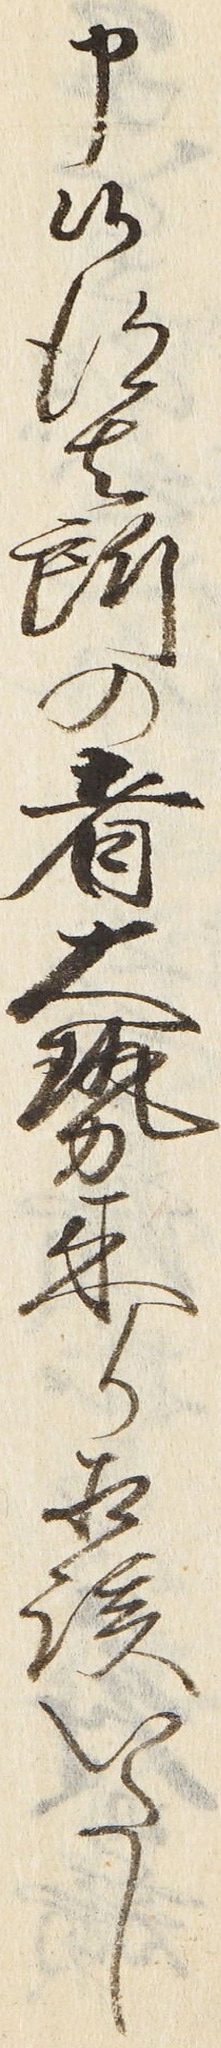申候得其所の者大勢来り相談いたし
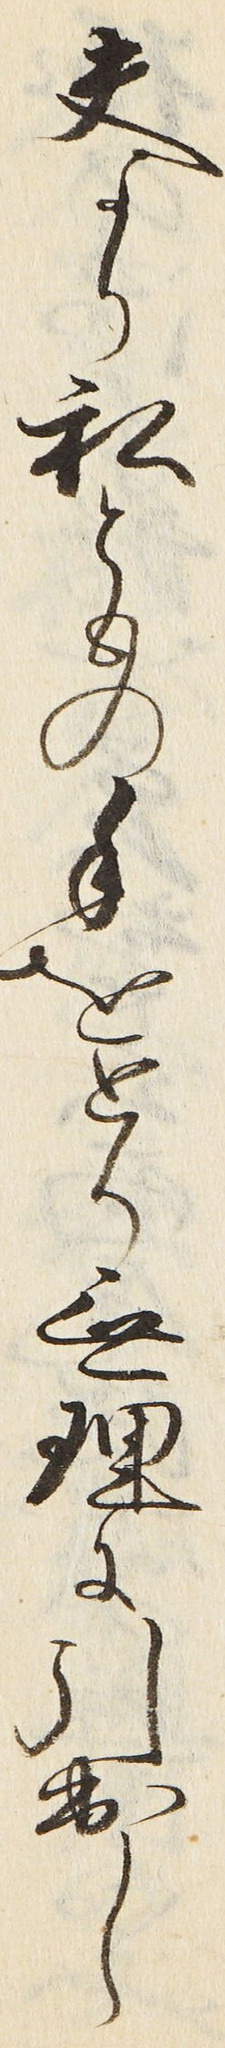夫より私ともの手をとり無理に引出し
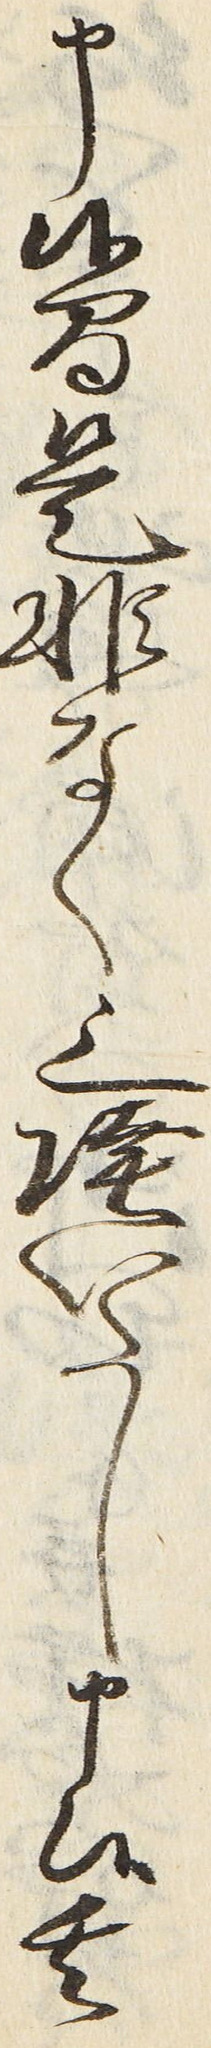申候間是非なく上陸いたし申候其
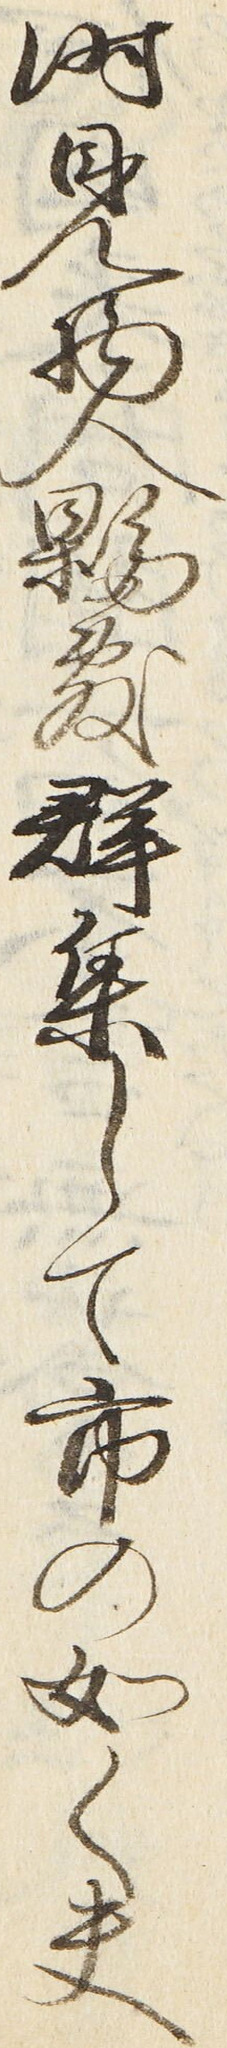時見物人夥敷群集して市の如く夫
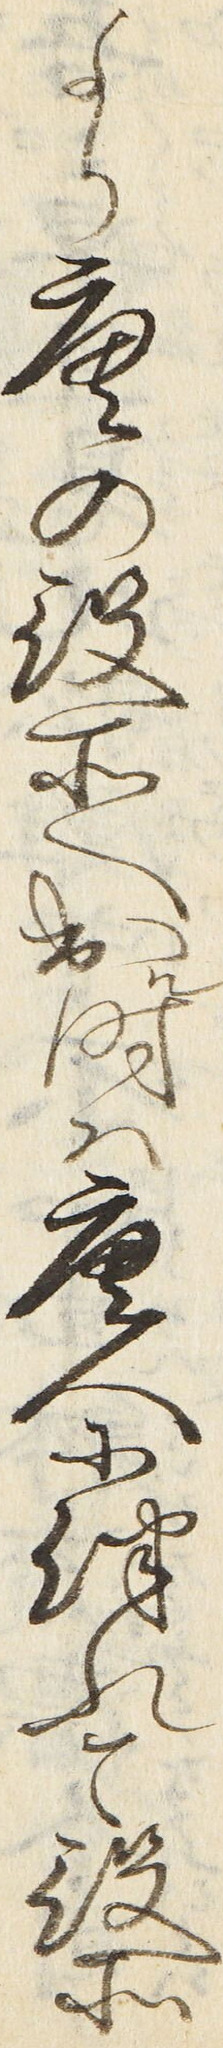より唐の役所へ出時は唐人に伴れて役所
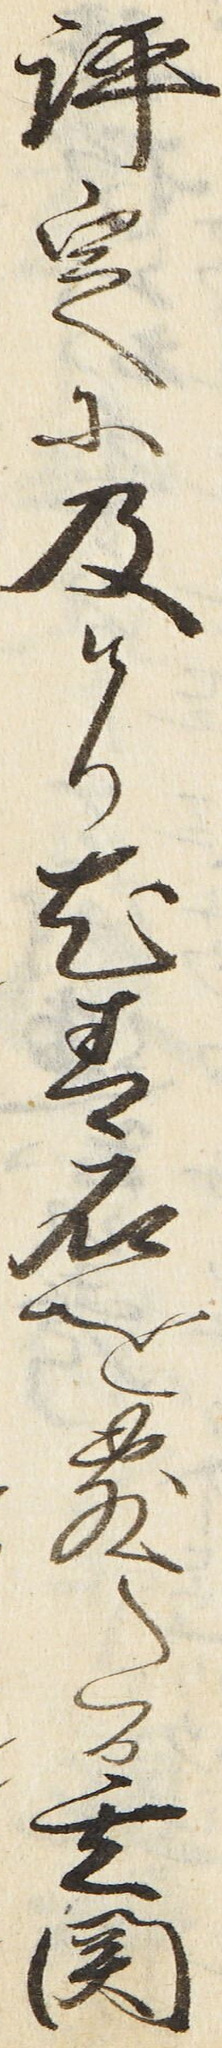評定に及けり尤青石を敷たる玄関
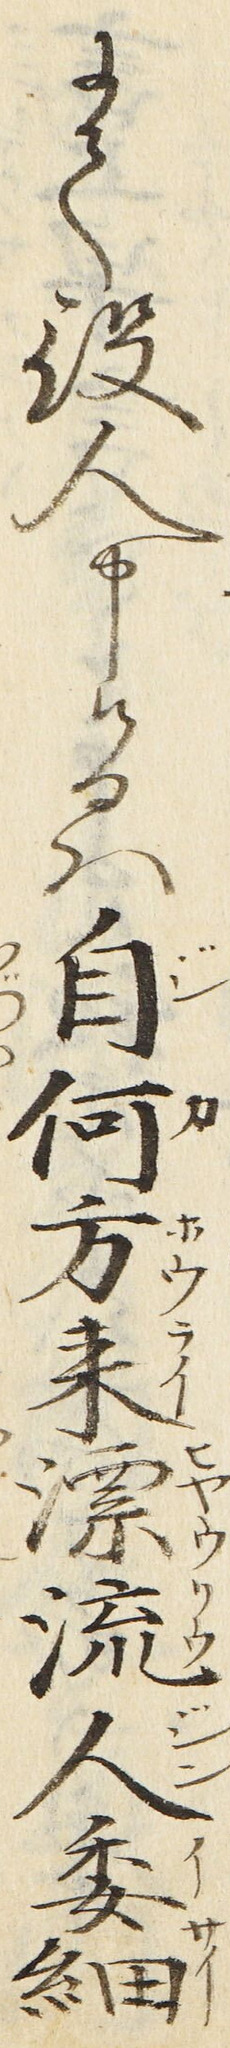にて役人申けるは自何方来漂流人委細
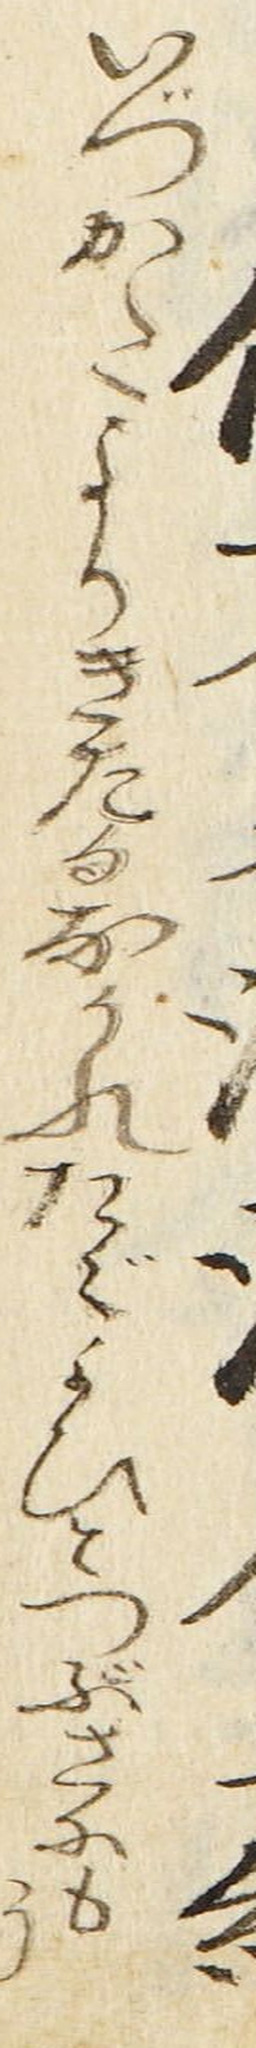いつかたよりきたるなかれたゞよひとつぶさにもう

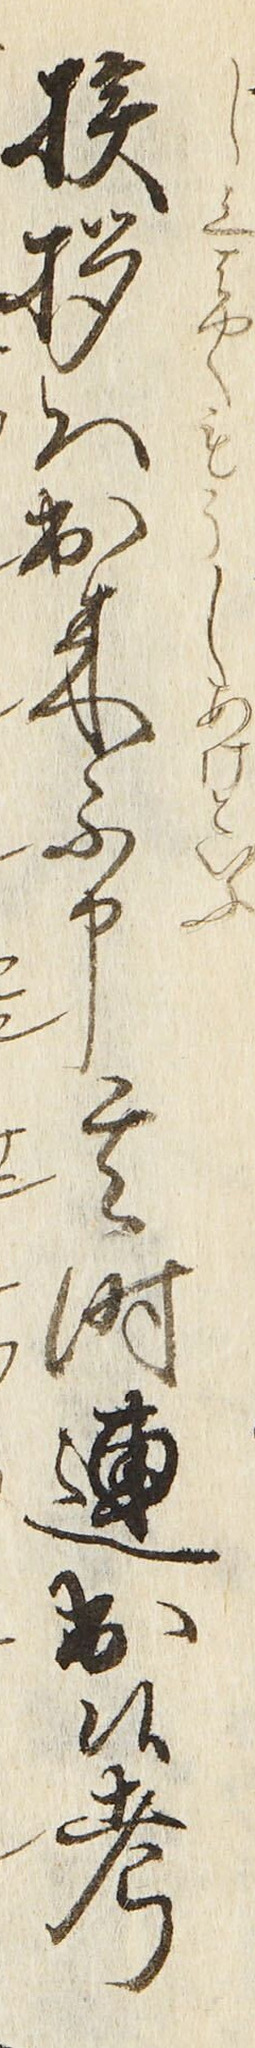挨拶は出来不申其時連出候考
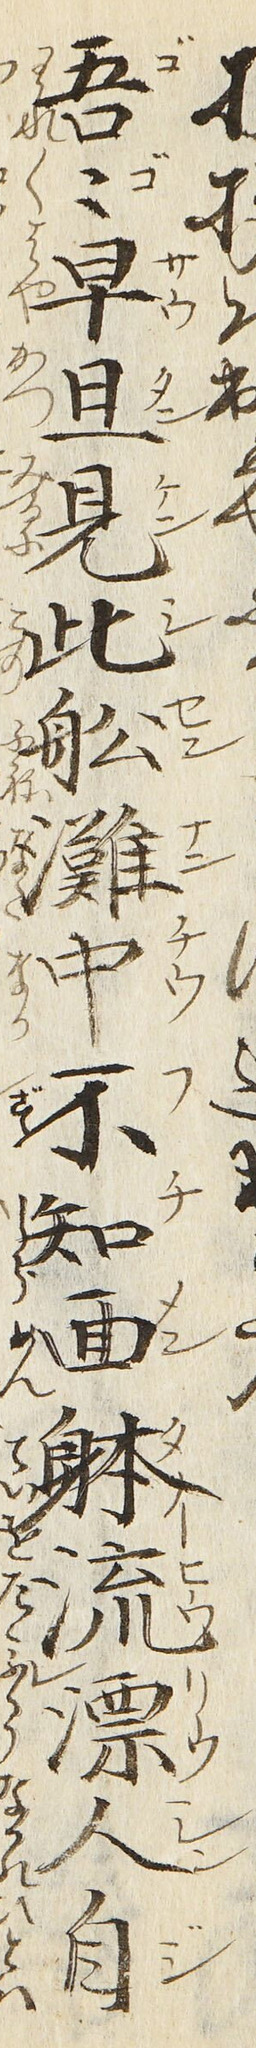吾々早旦見此船灘中不知面体流流漂人自
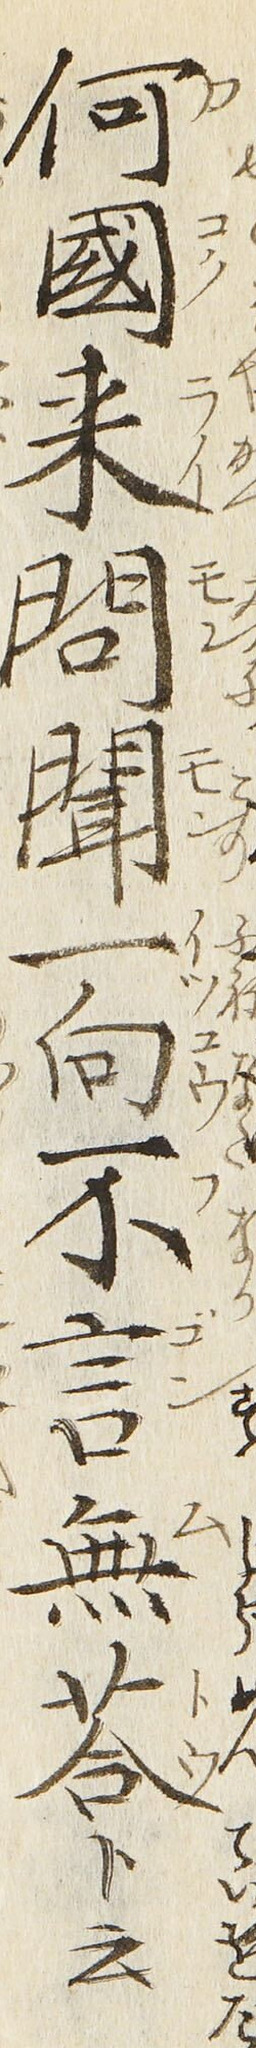何国来問聞一向不言無答ト云
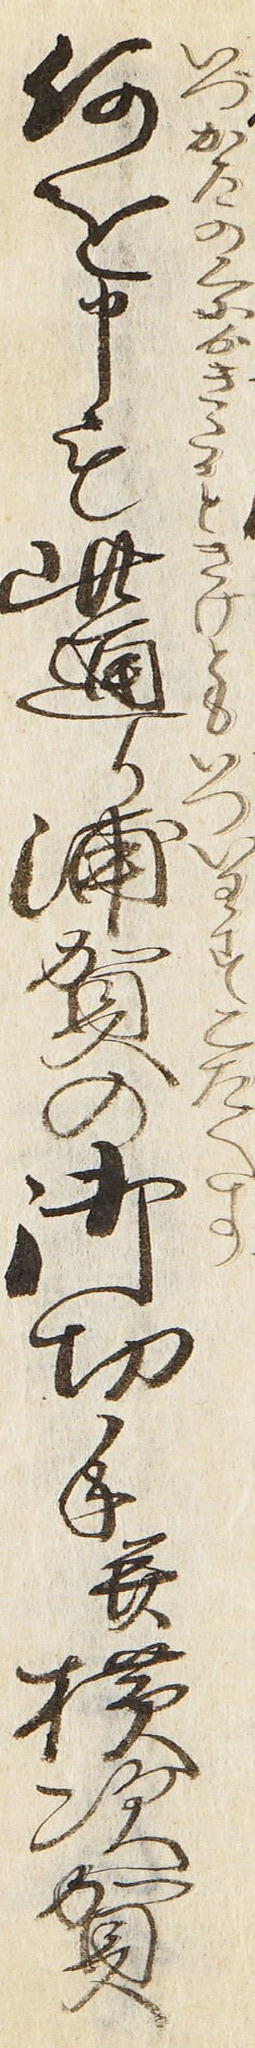何を申も此通り浦賀の御切手并横須賀
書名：天保漂流記
